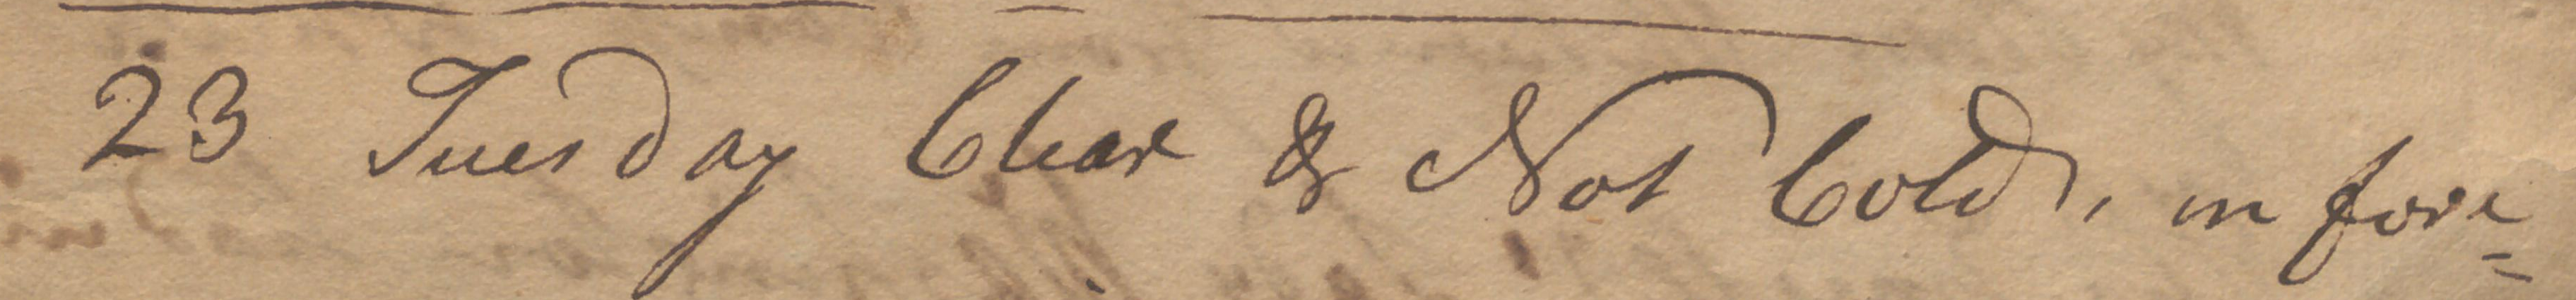23 Tuesday Clear & Not Cold, in fore
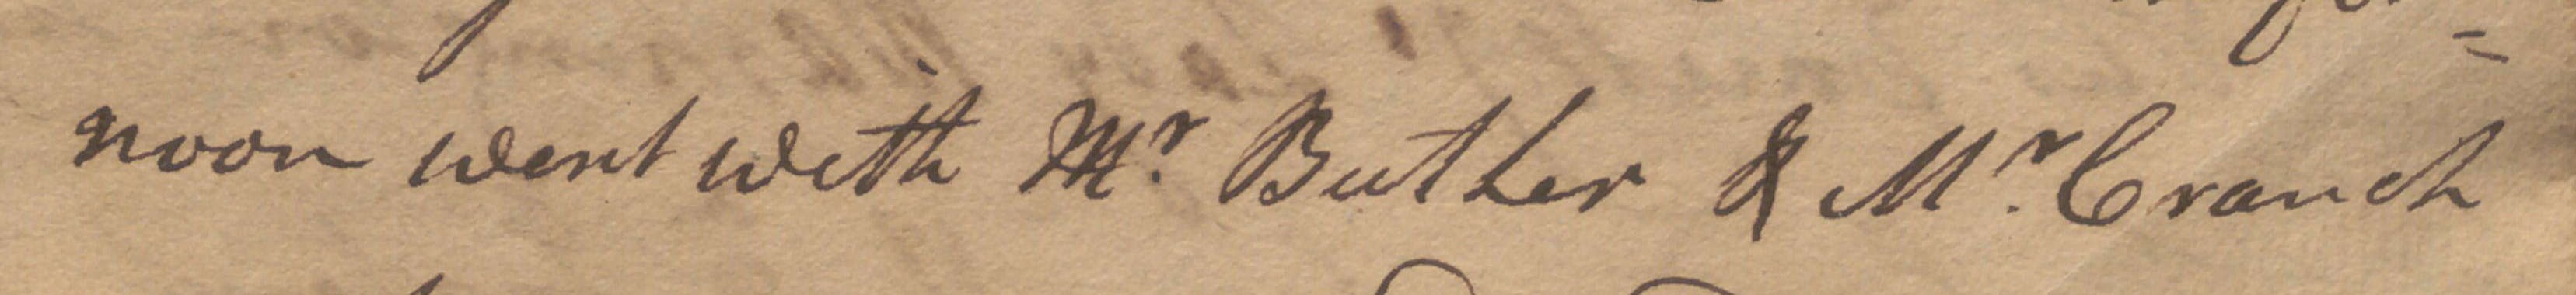noon went with M^r. Butler & M^r. Cranch
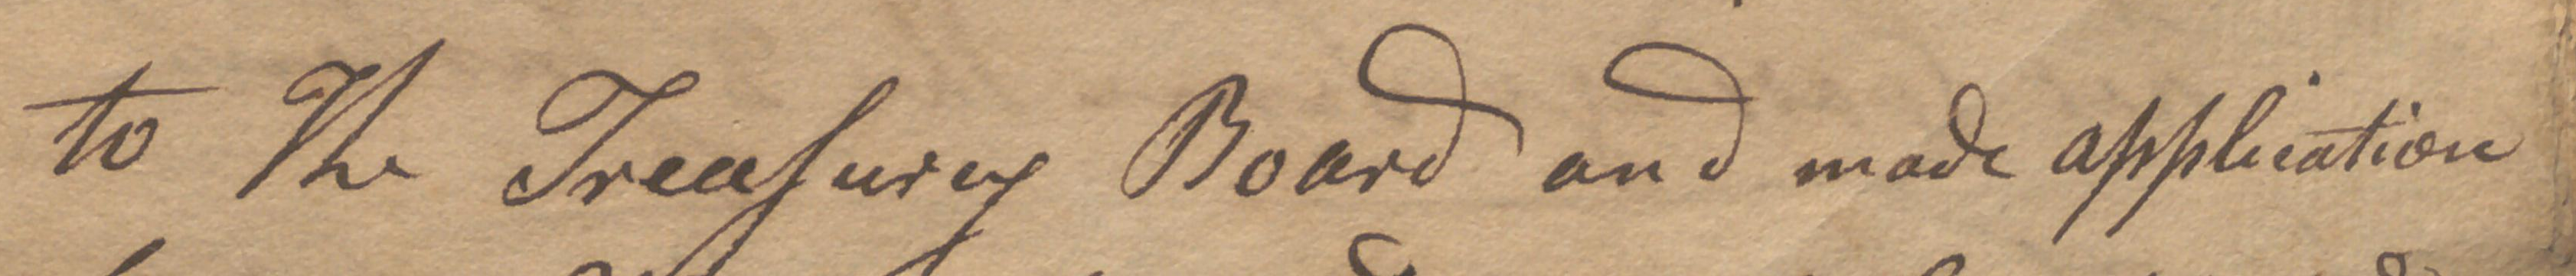to The Treasury Board and made application
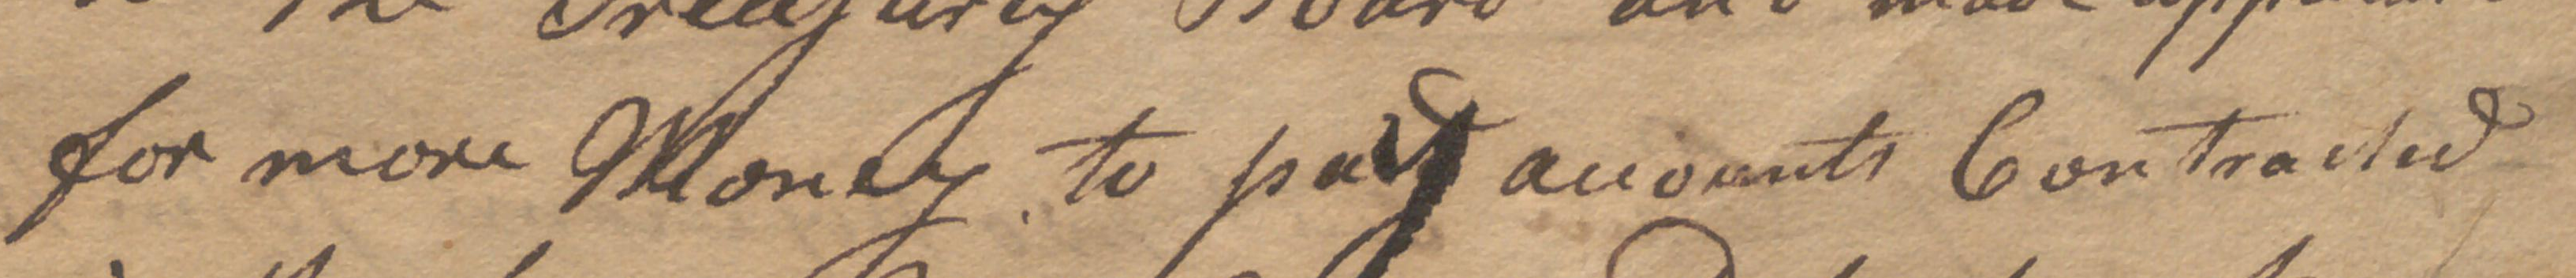for more Money to pay accounts Contracted
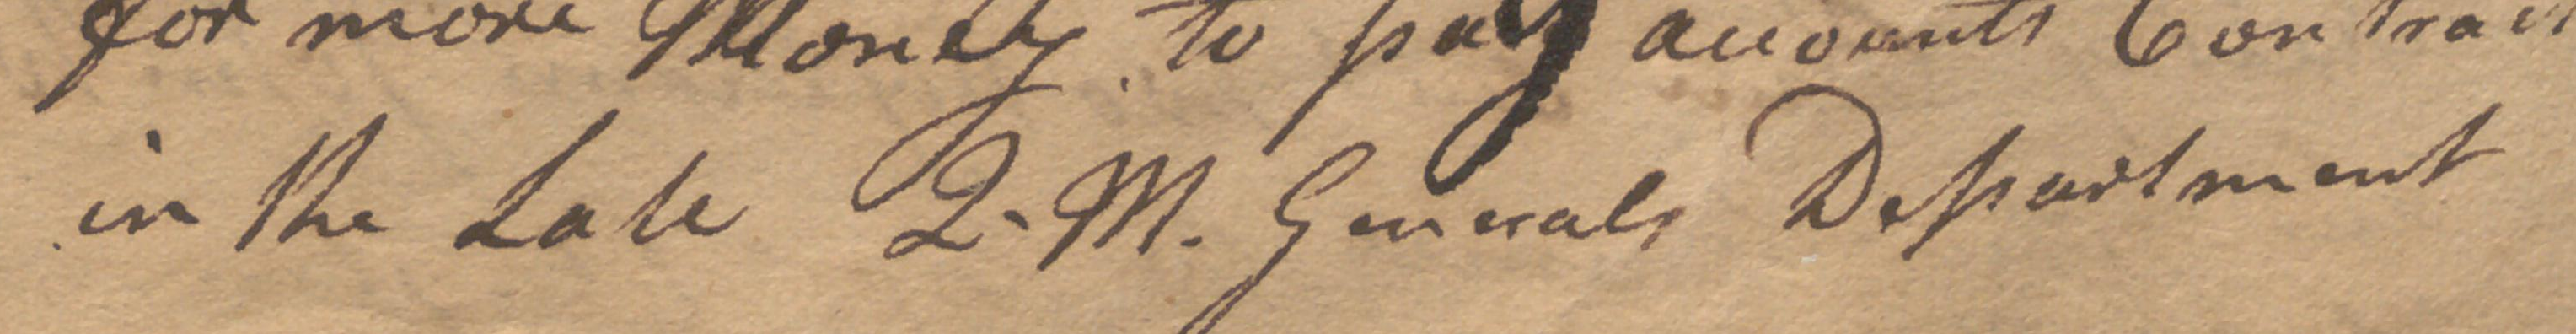in the Late Qr. M. Generals Department
